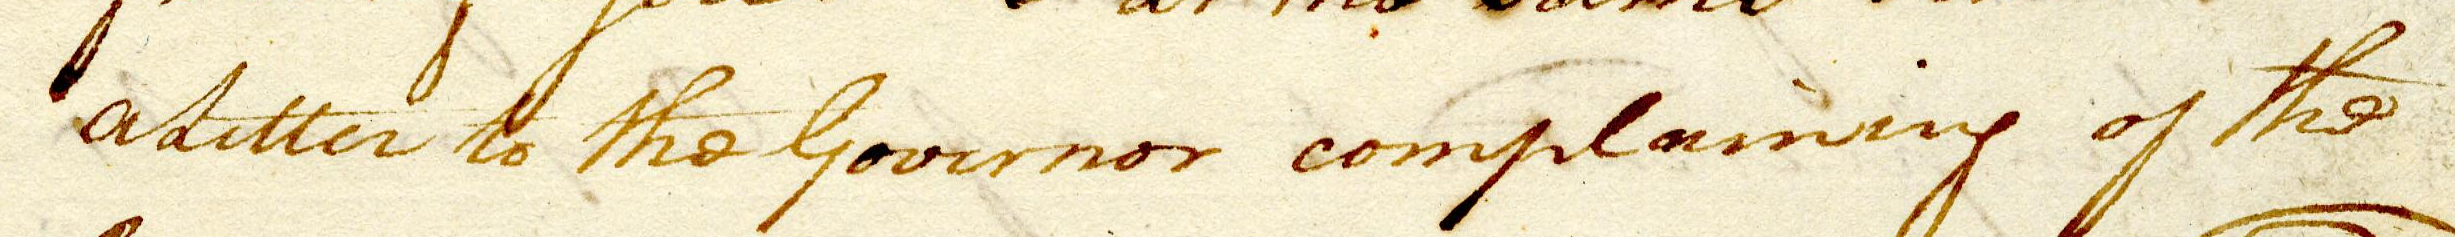a Letter to the Governor complaining of the
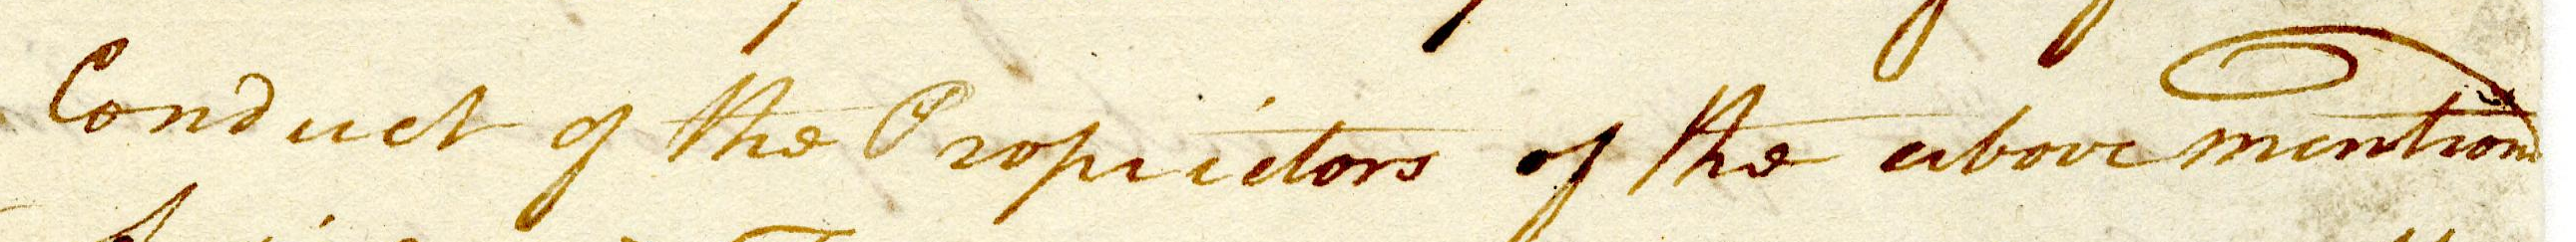Conduct of the Proprietors of the abovemention'd
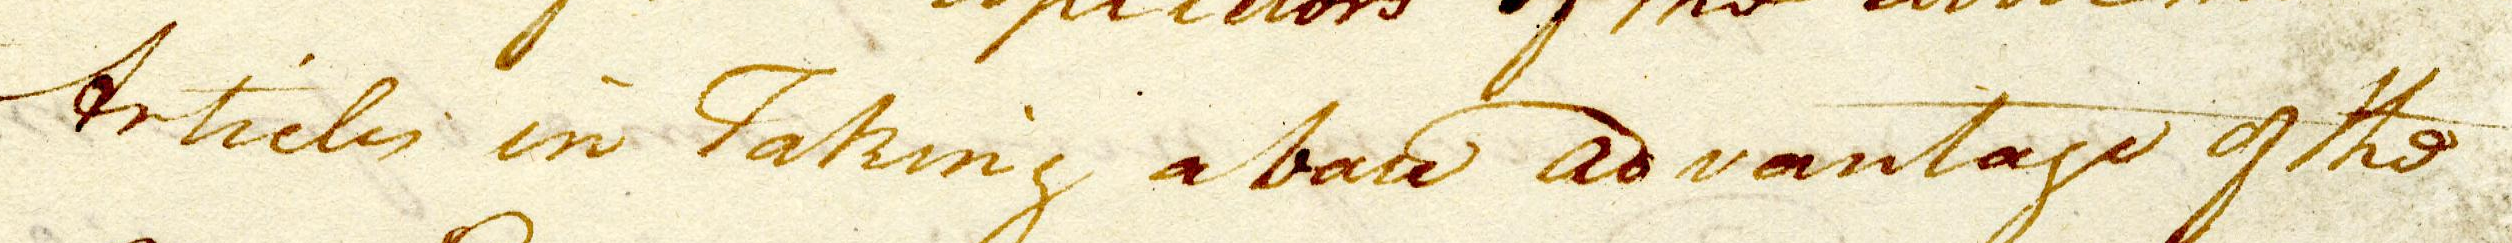Articles in Taking a base advantage of the
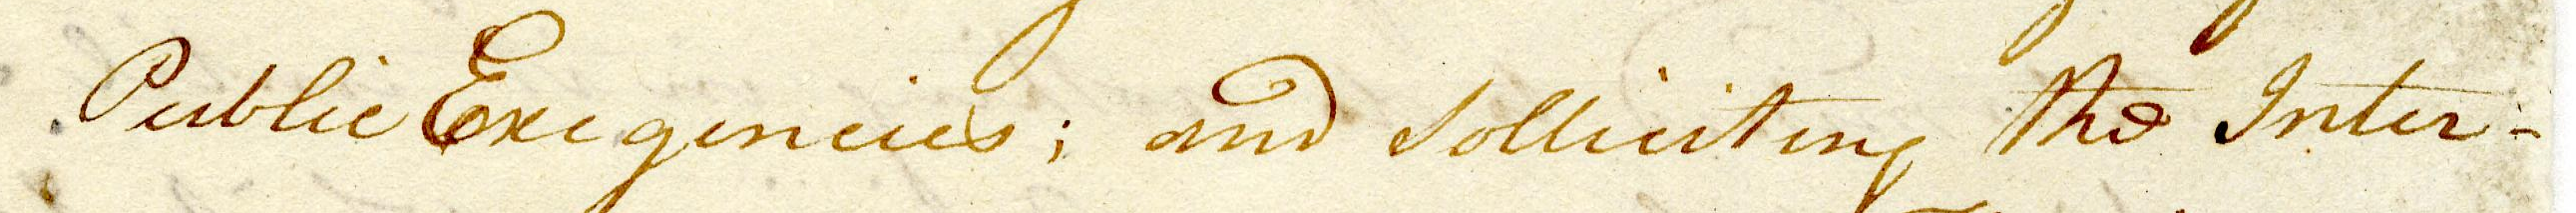Public Exegencies; and Solliciting the Inter-
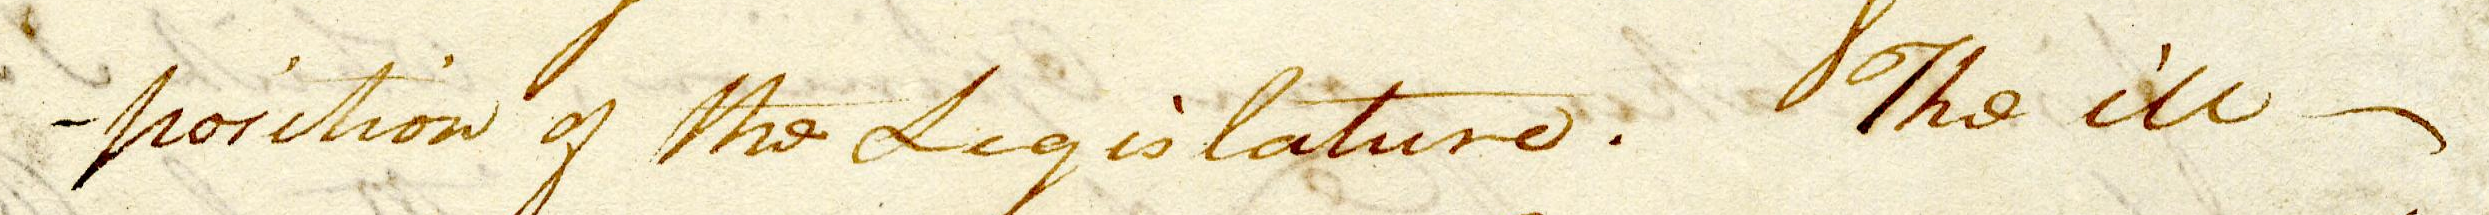-position of the Legislature. The ill-
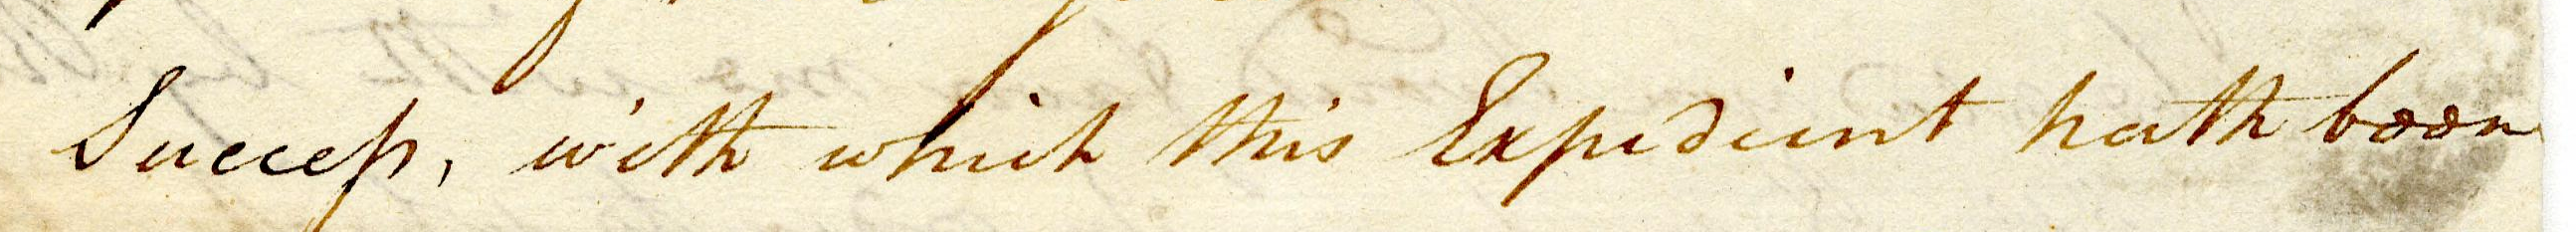Success, with which this Expedient hath been
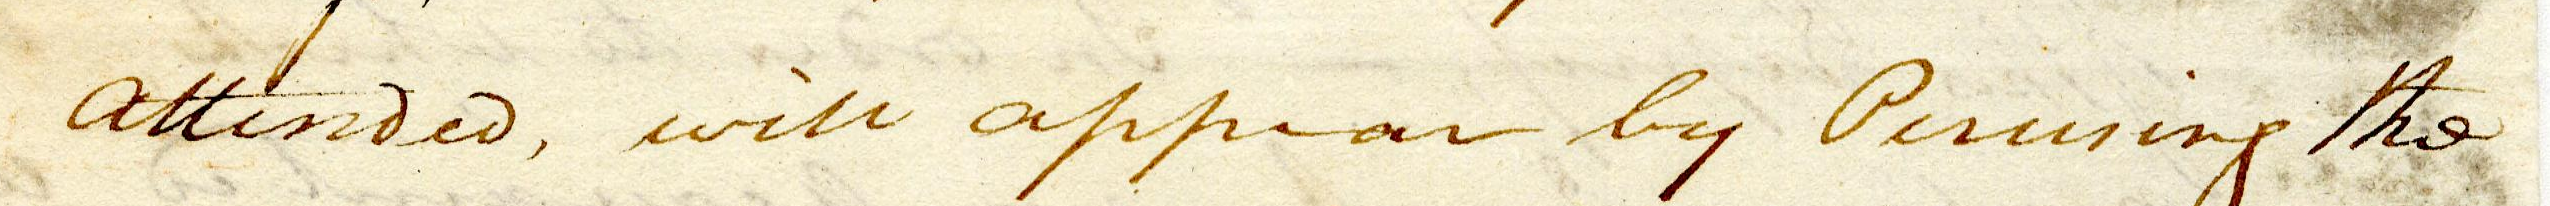attended, will appear by Perusing the
